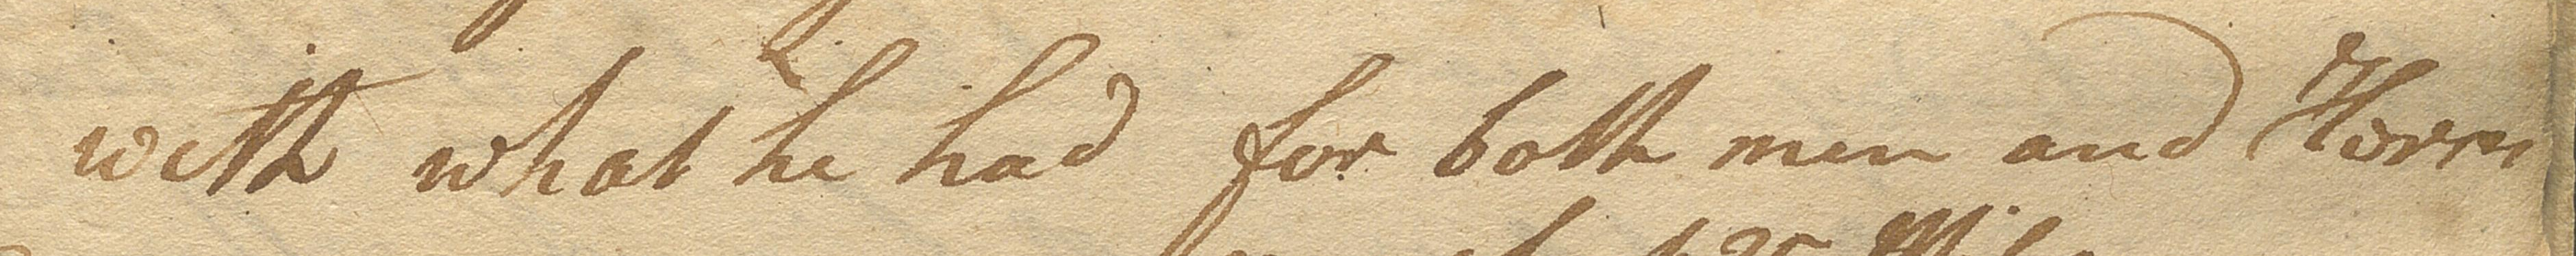with what he had for both men and Horses
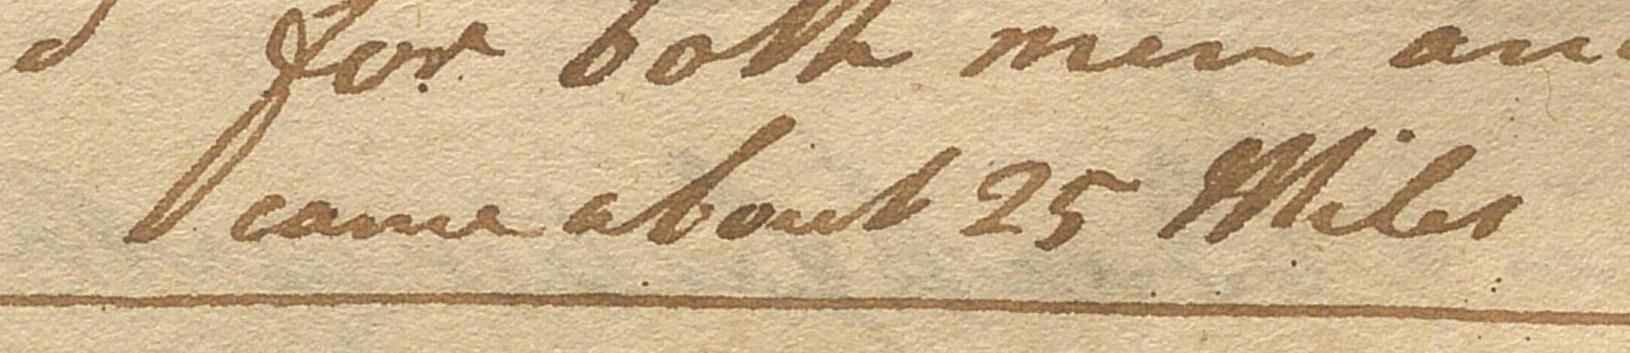came about 25 Miles
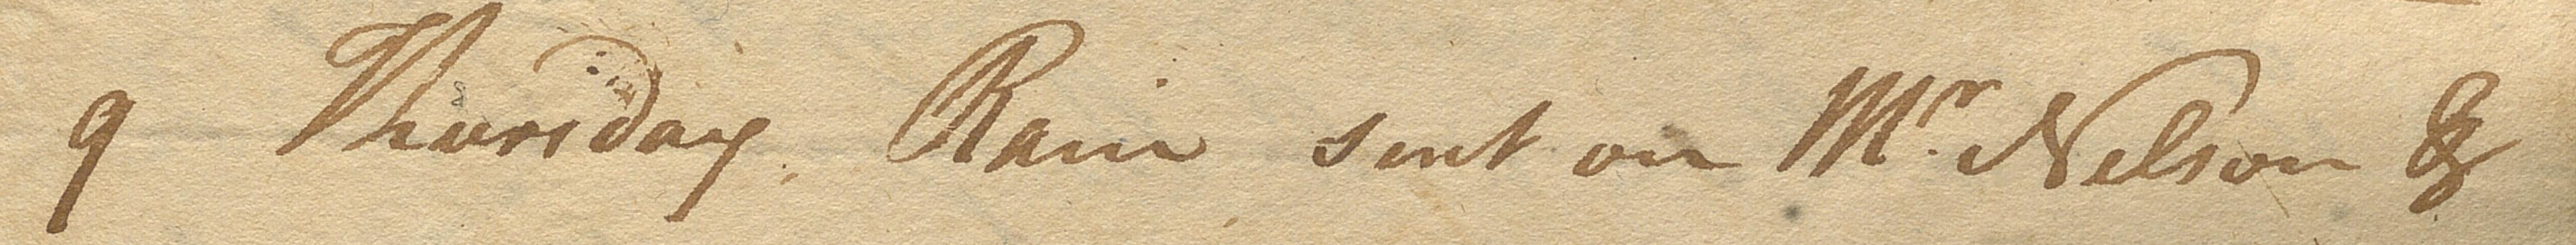9 Thursday. Rain sent on M^r. Nelson &
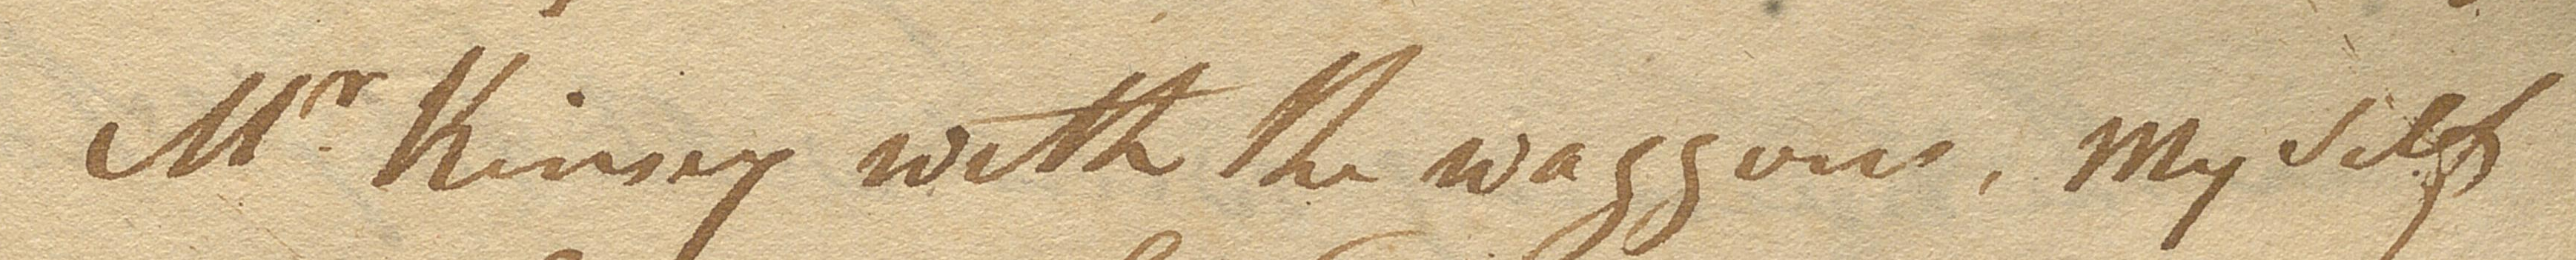M^r. Kinsey with the waggons, My self
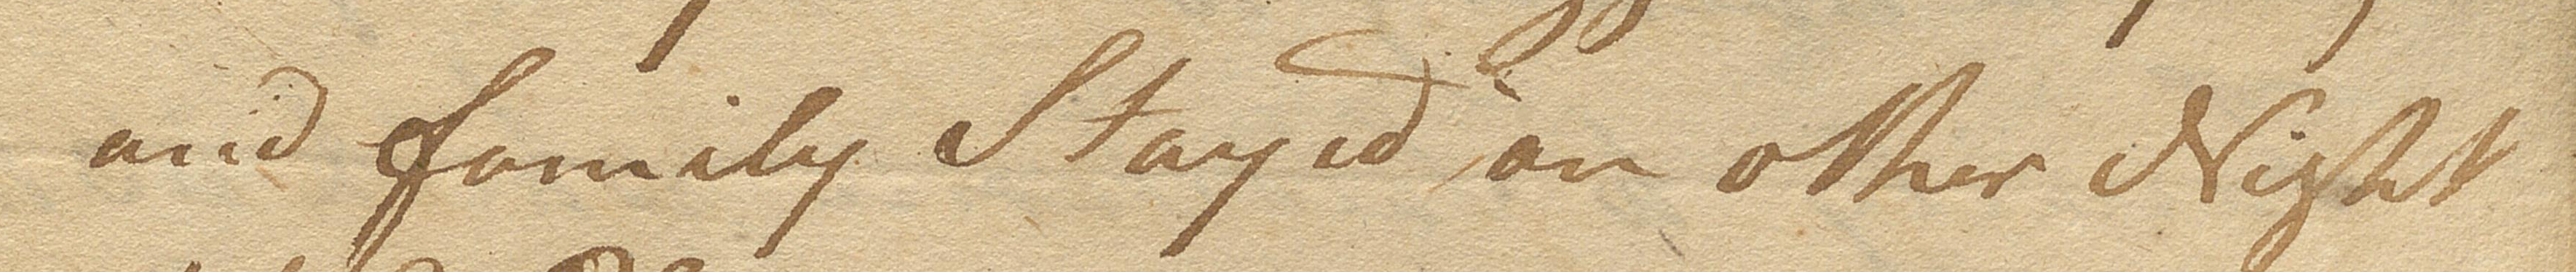and family Stayed on other Night
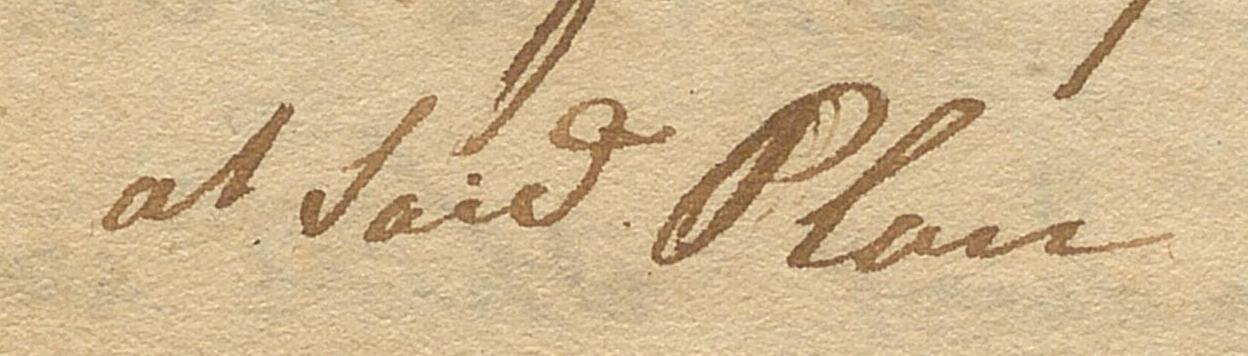at Said Plan
